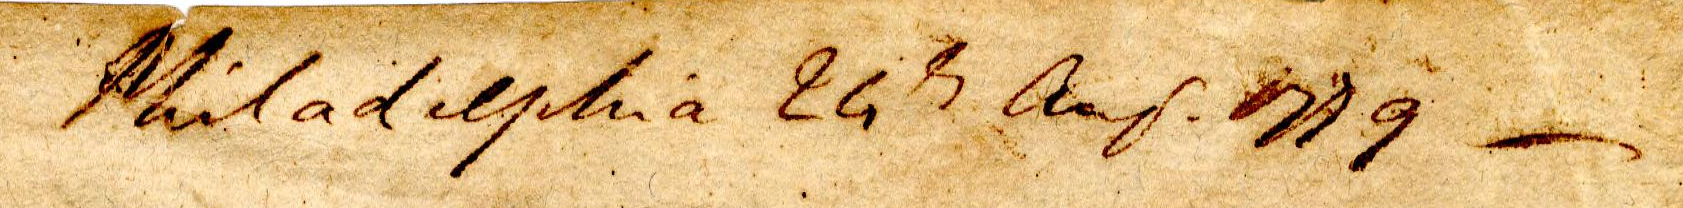Philadelphia 24^th Aug^t. 1779
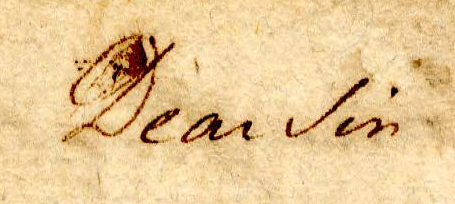Dear Sir
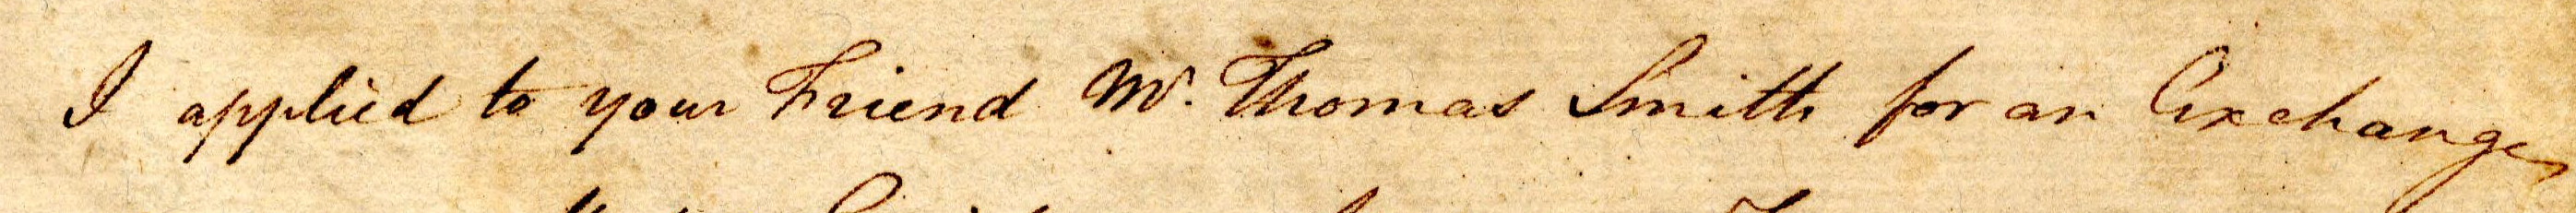I applied to your Friend M^r. Thomas Smith for an Exchange
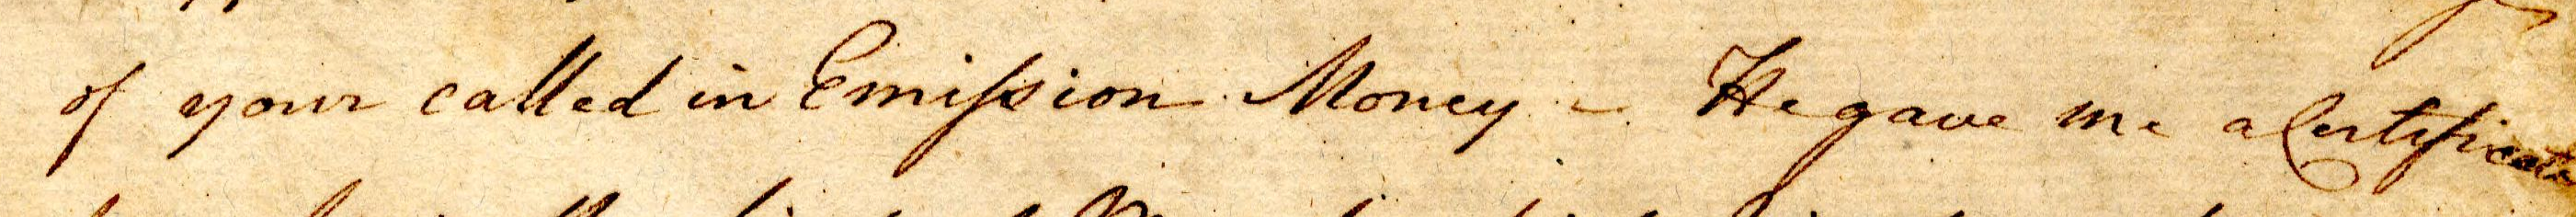of your called in Emission Money. He gave me a Certificate
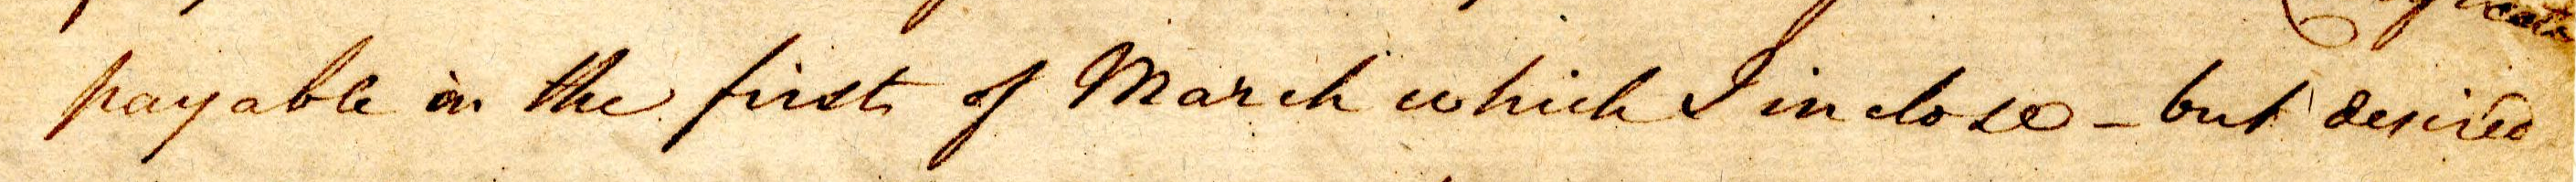payable on the first of March which I inclose, but desired
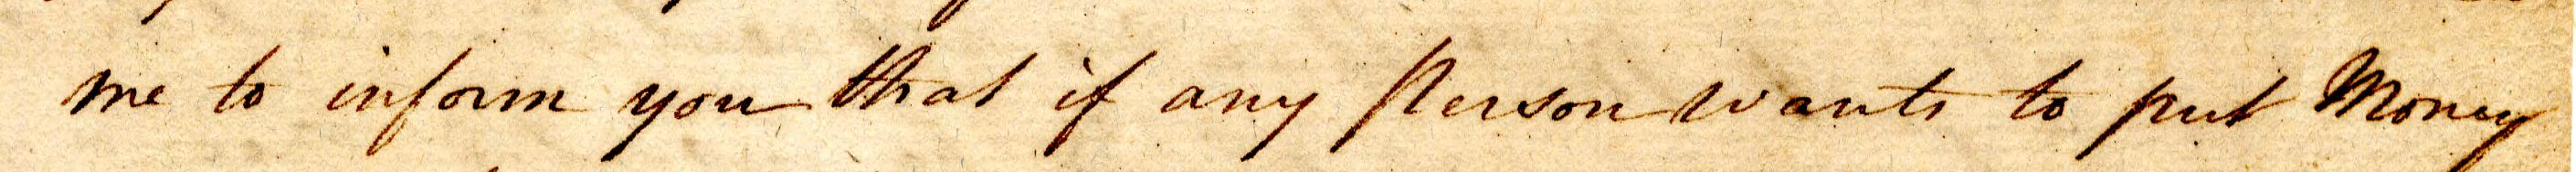me to inform you that if any person wants to put Money
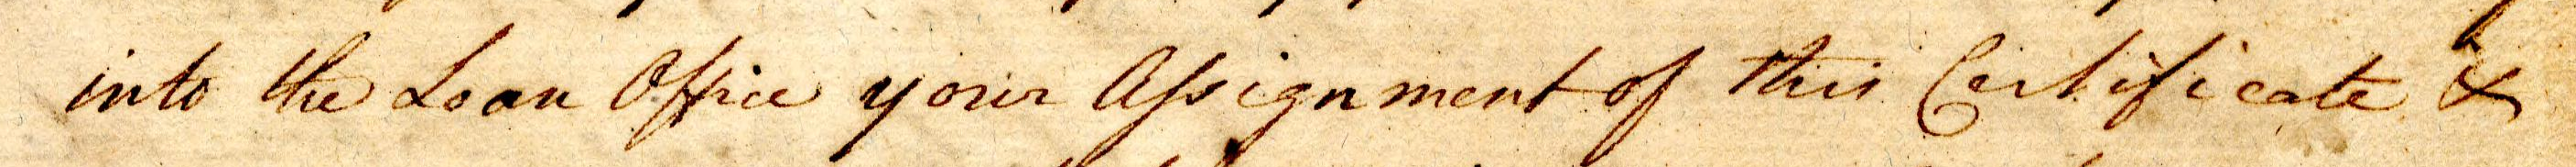into the Loan Office your Assignment of this Certificate &
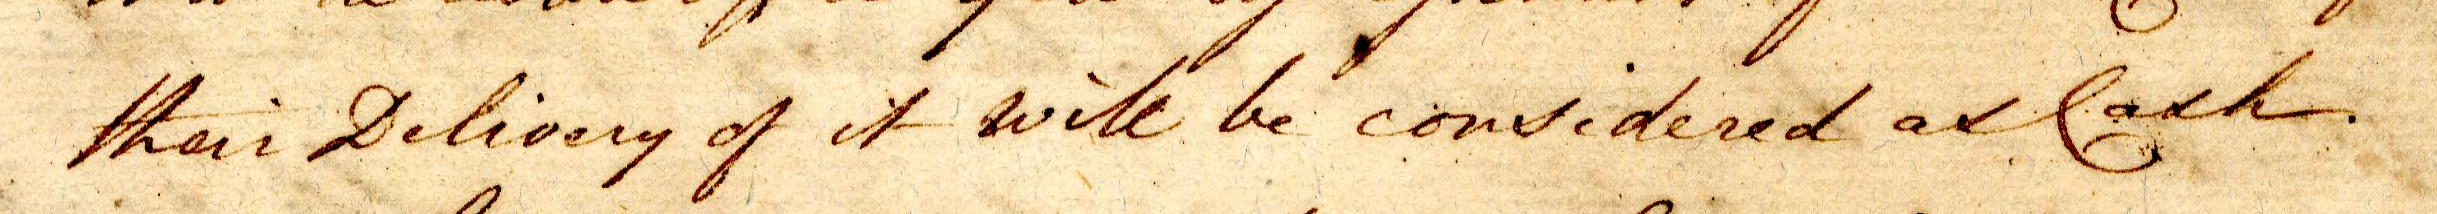their Delivery of it will be considered as Cash.
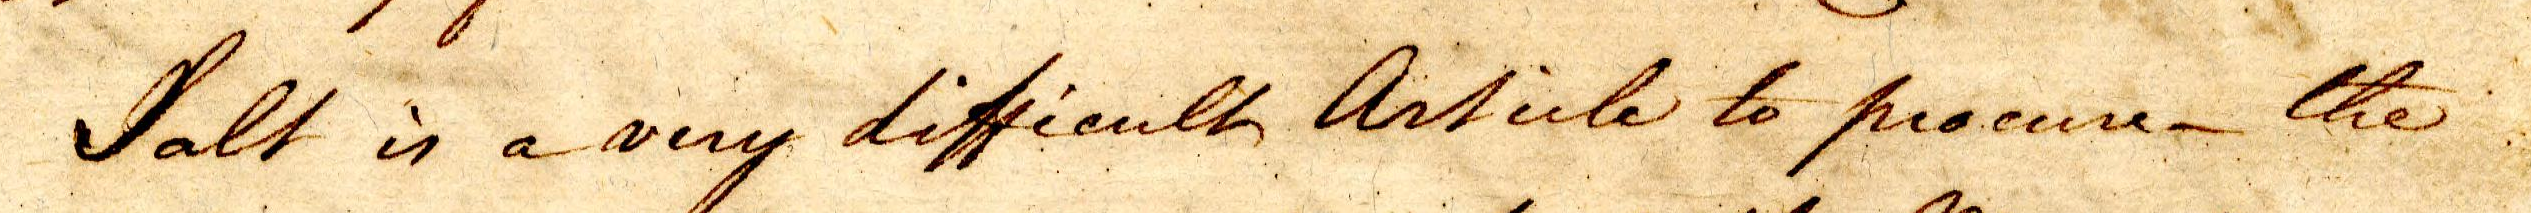Salt is a very difficult Article to procure. the
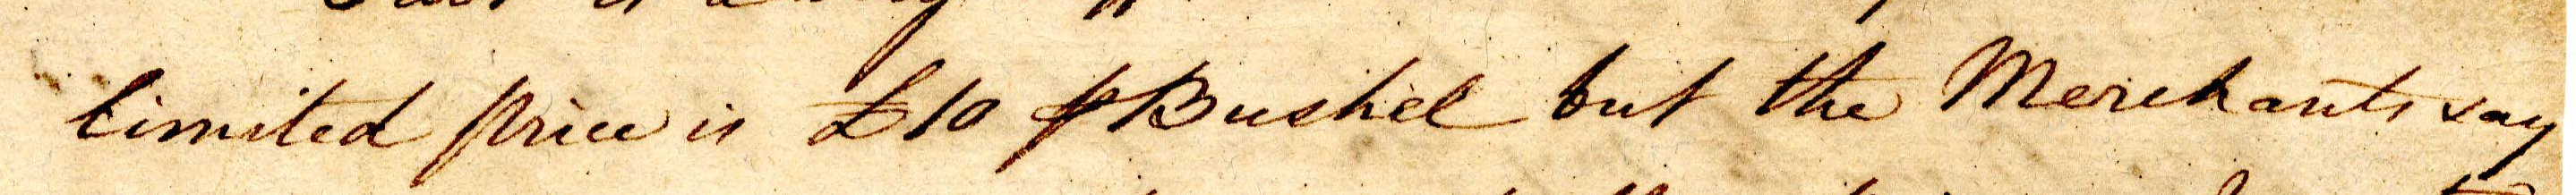limited price is £10 per Bushel but the Merchants say
